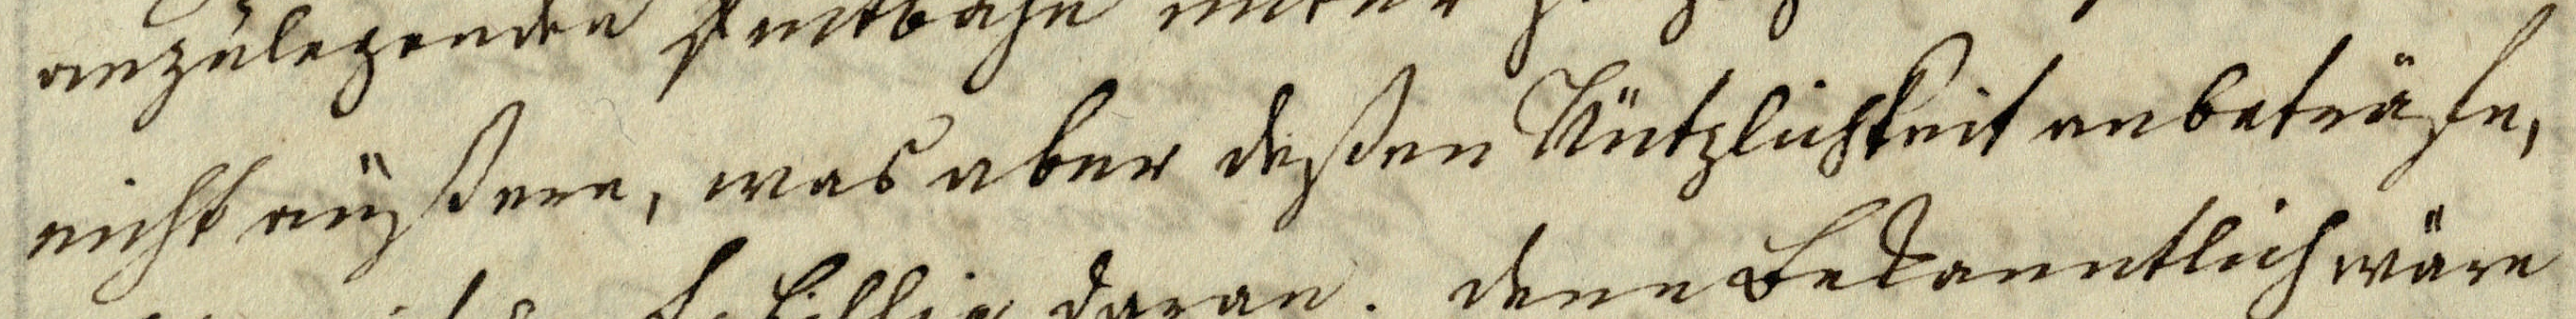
nicht äußern, was aber deßen Nützlichkeit anbeträfe,
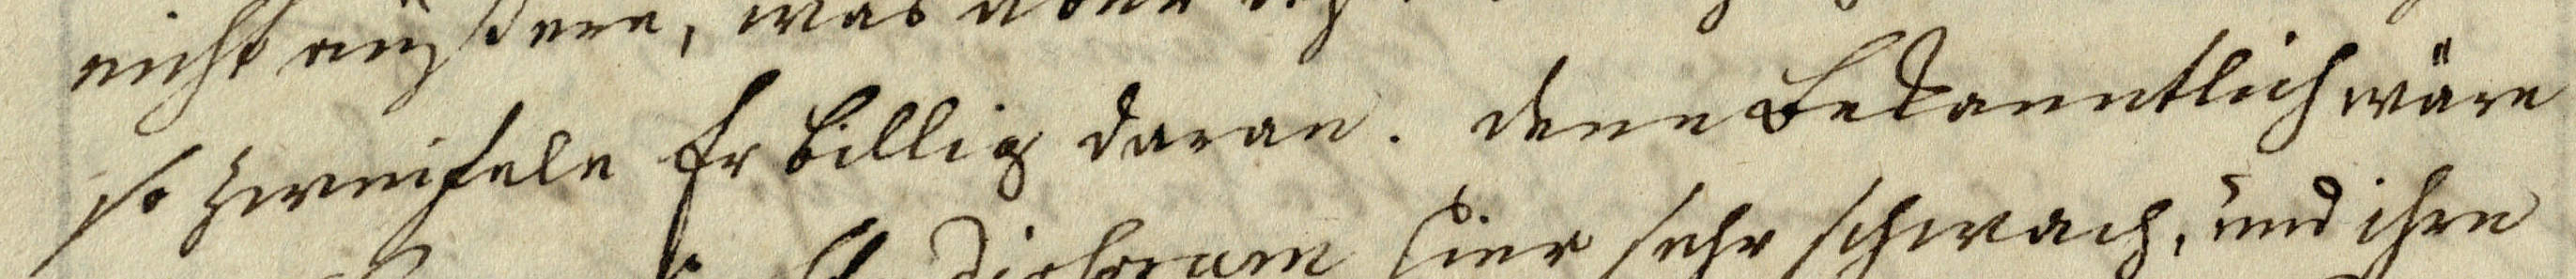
so zweifele Er billig daran, denn bekanntlich wäre
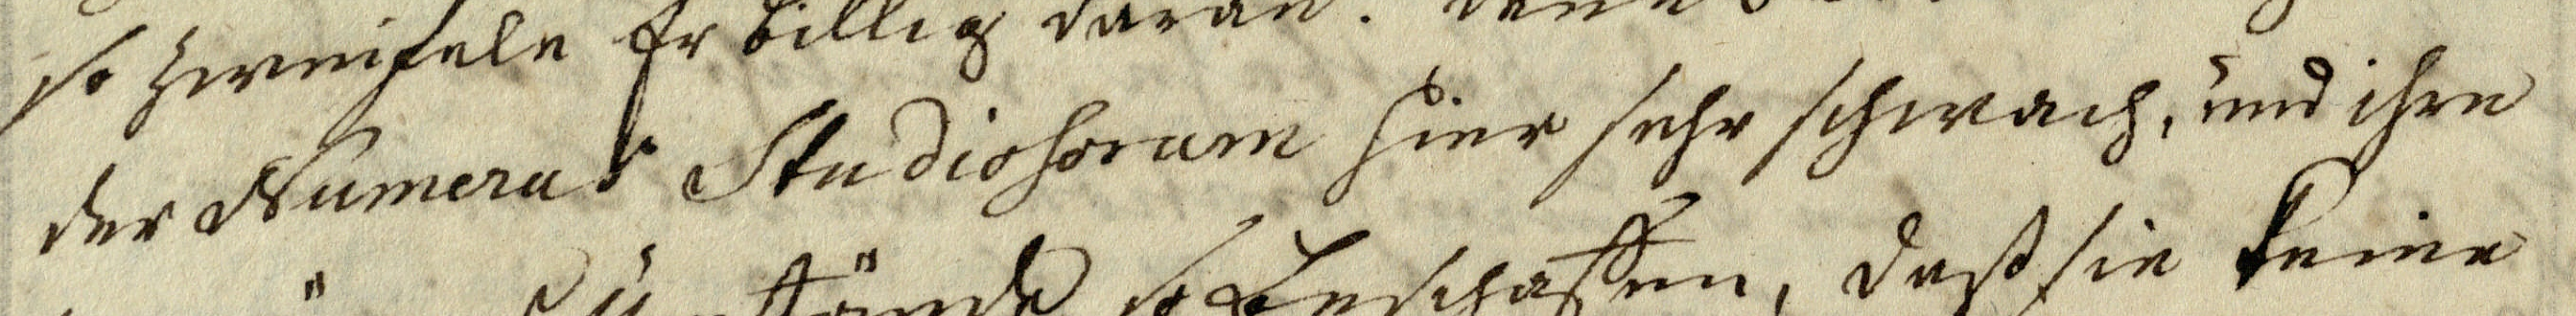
der Numerus Studiosorum hier sehr schwach, und ihre
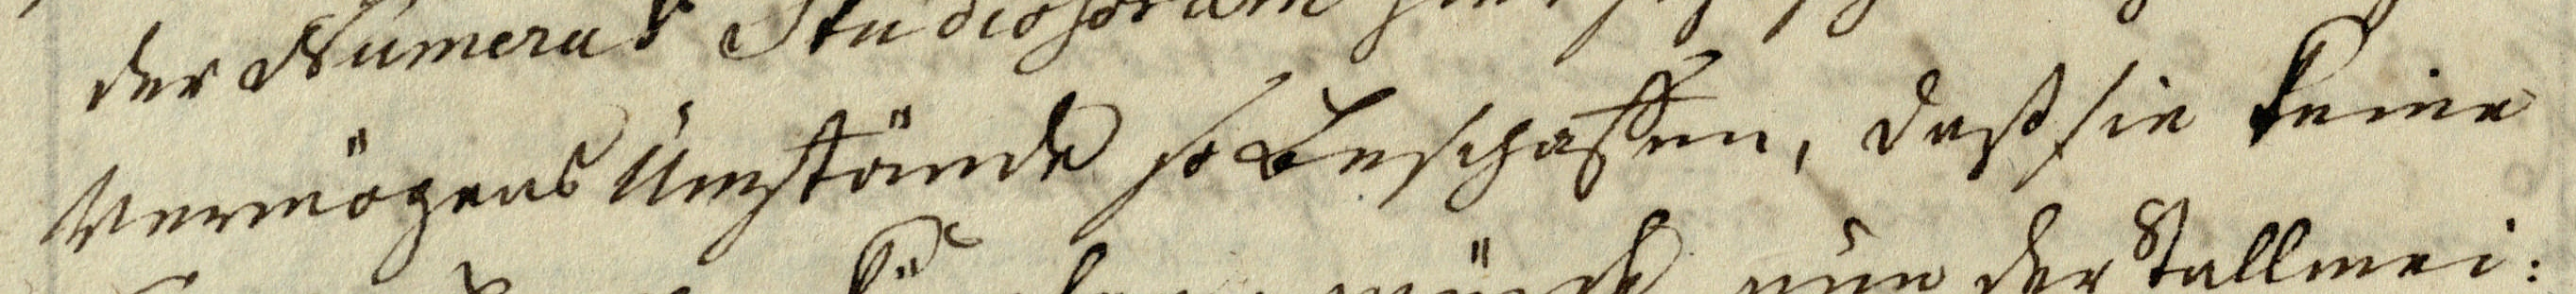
Vermögens Umstände so beschaffen, daß sie keine
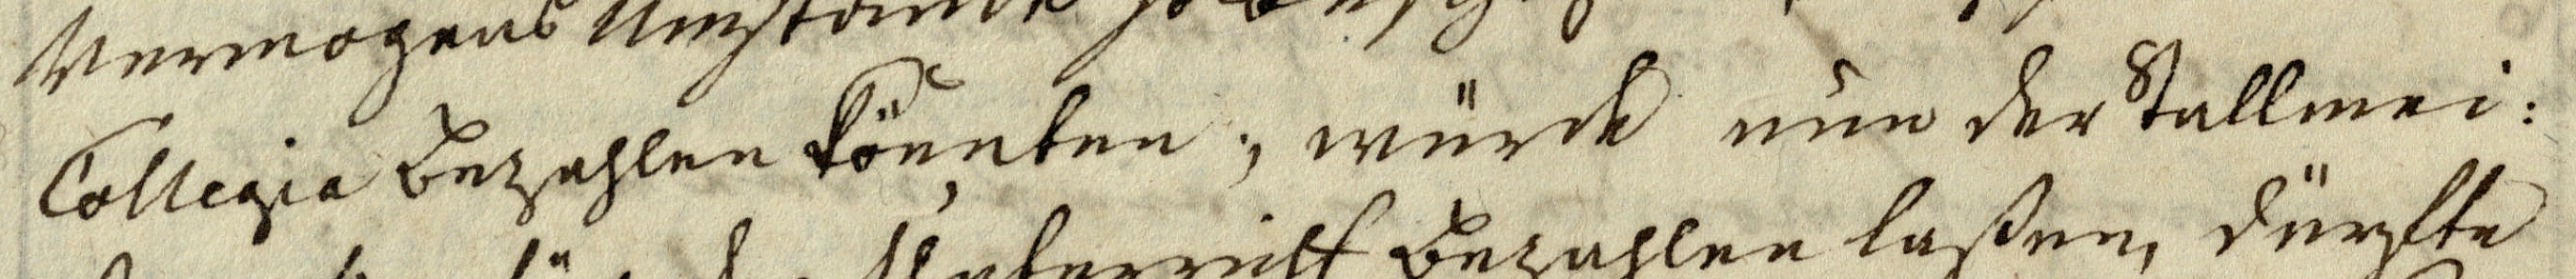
Collegia bezahlen könnten; würde nun der Stallmei¬
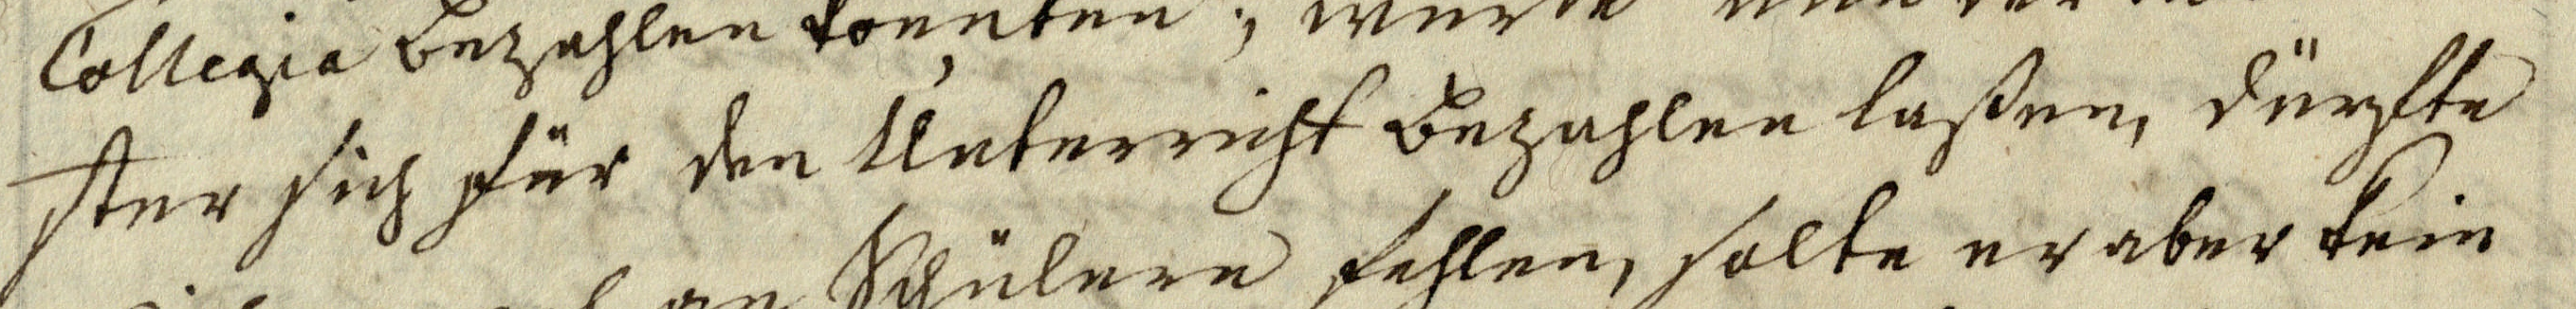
ster sich für den Unterricht bezahlen laßen, dürfte
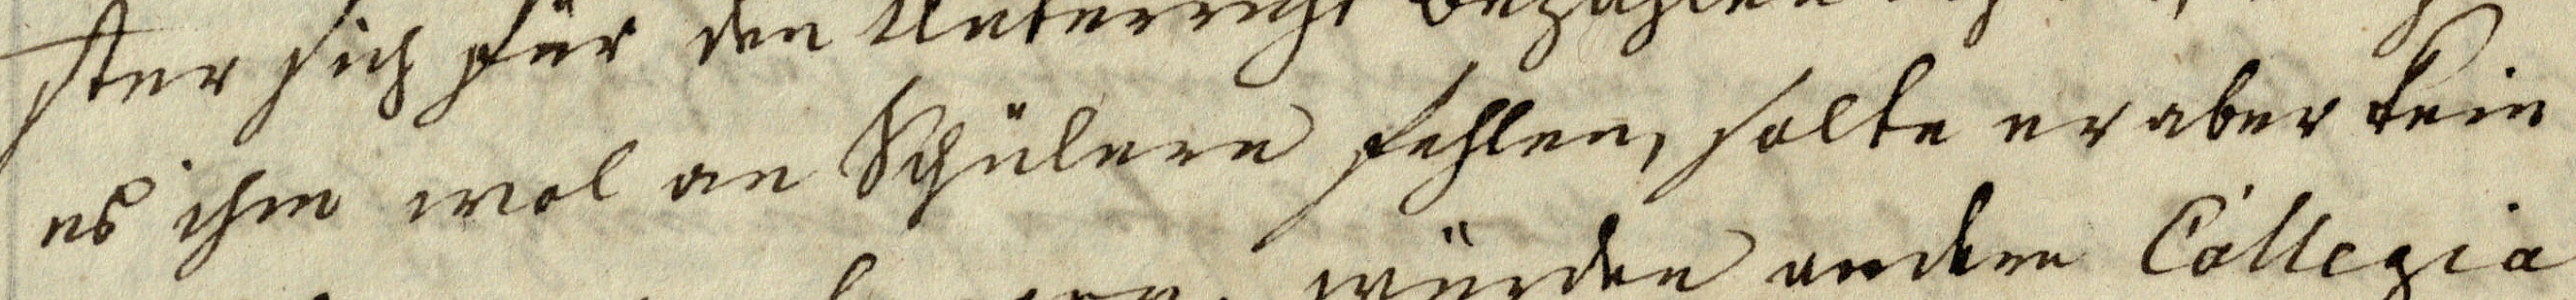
es ihm wol an Schülern fehlen, solte er aber kein
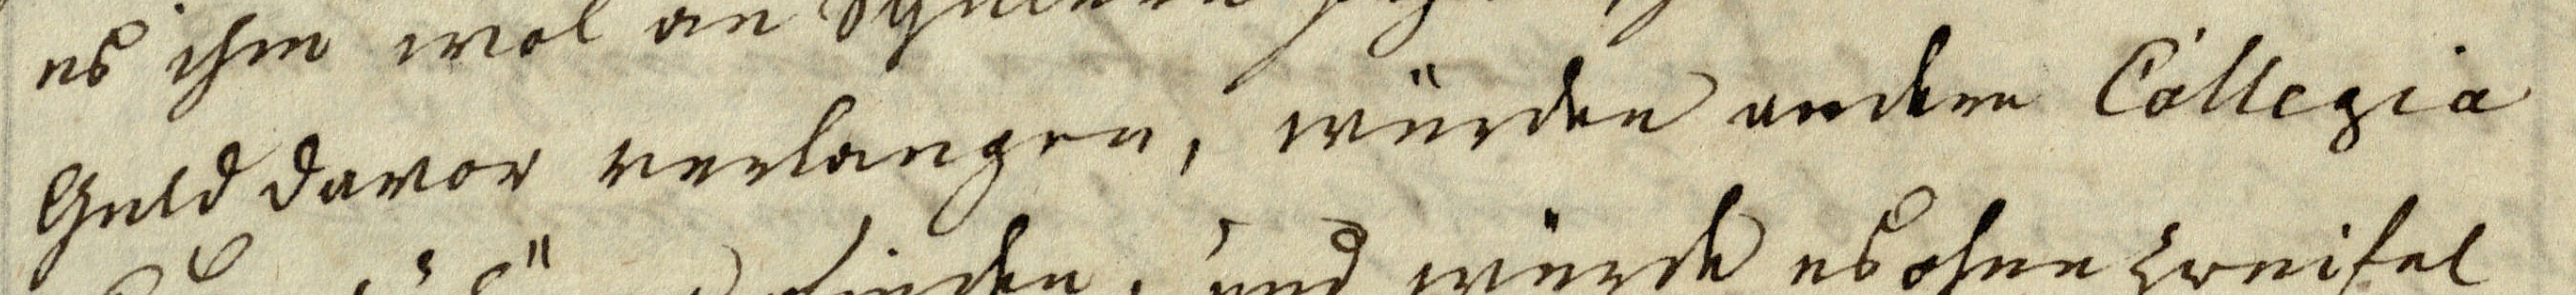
Geld davor verlangen, würden andere Collegia
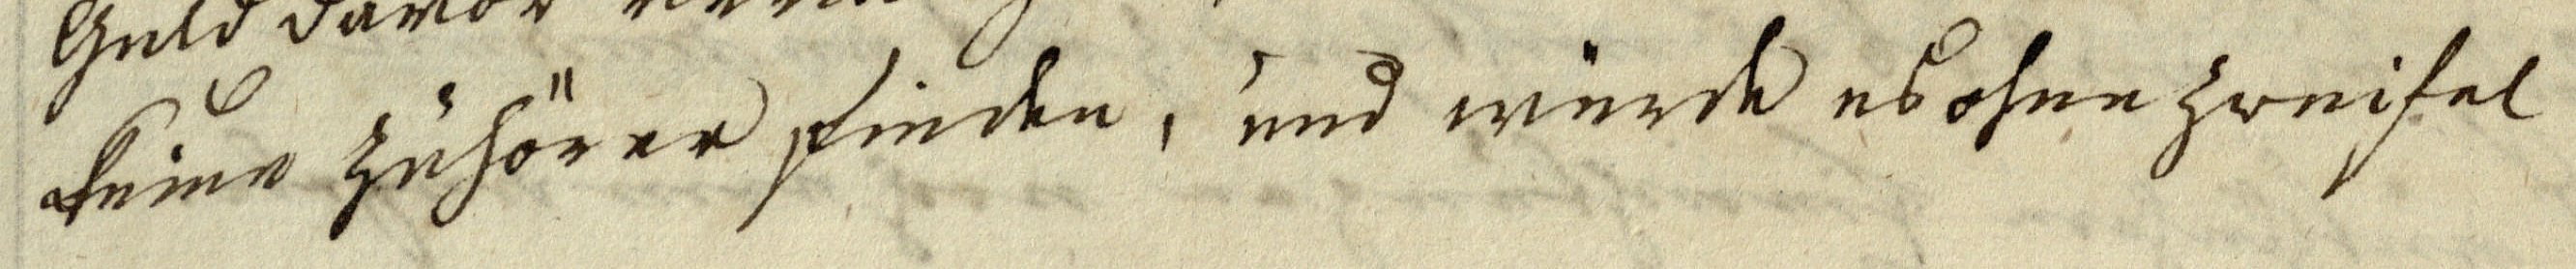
keine Zuhörer finden, und würde es ohne Zweifel
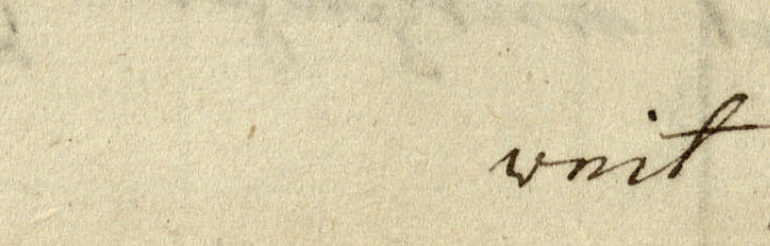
weit
